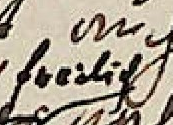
freilich
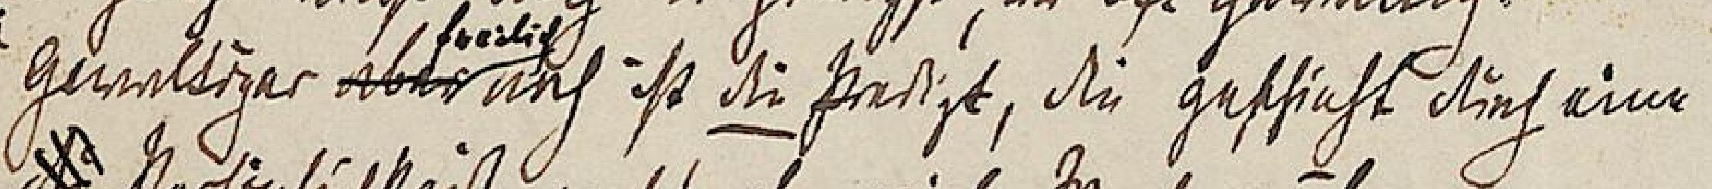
Gewaltige aber auch ist die Predigt, die geschieht durch eine
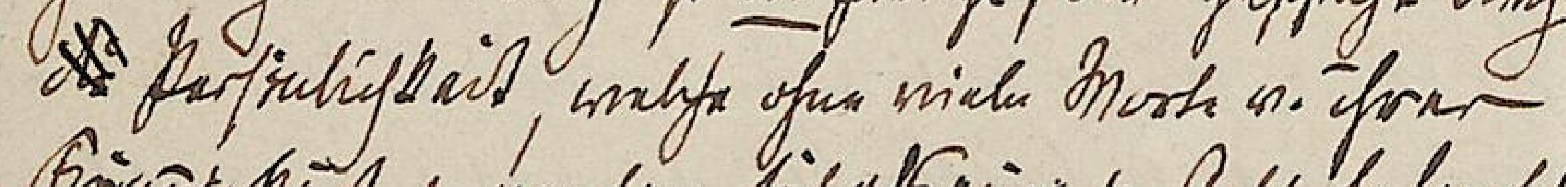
die Persönlichkeit, welche ohne viele Worte v. ihrer
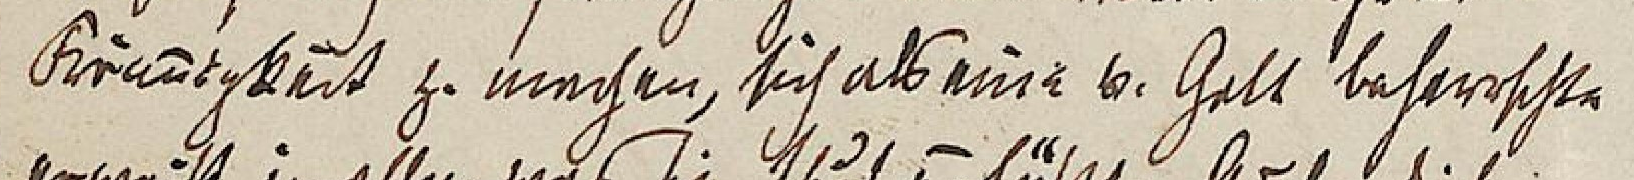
Frömigkeit z. machen, sich als eine v. Gott beherrschte
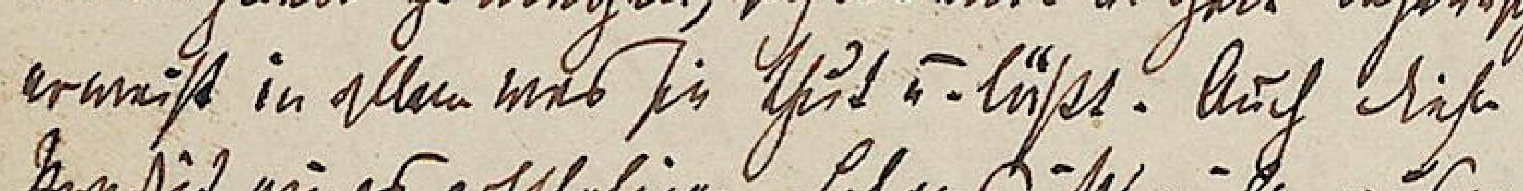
erweist in allem was sie thut u. läßt. Auch diese
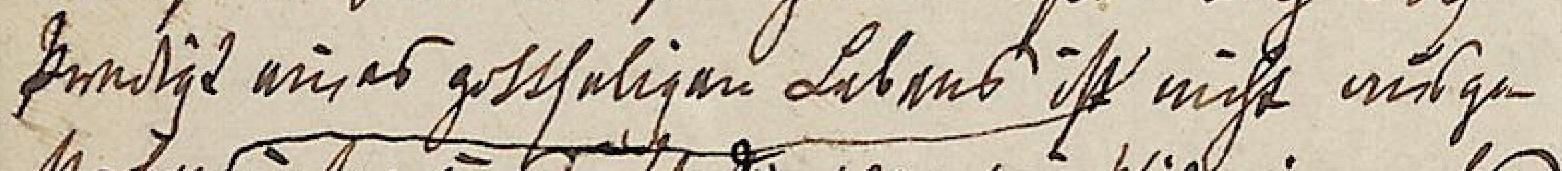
Predigt eines gottseligen Lebens ist nicht ausge¬
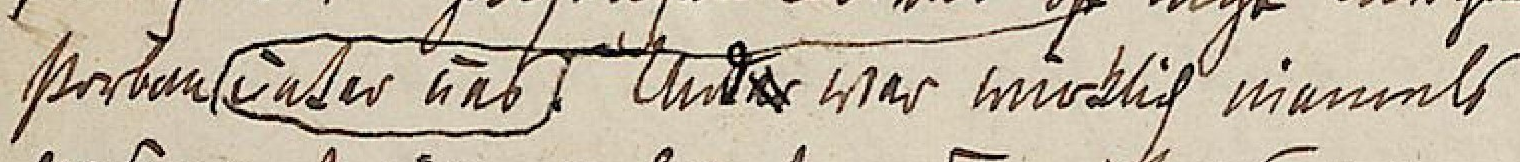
storben unter uns! Und wer wirklich niemals
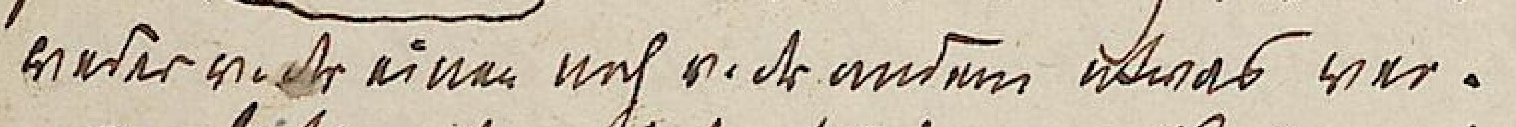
weder v. dr einen noch v. der andern etwas ver¬
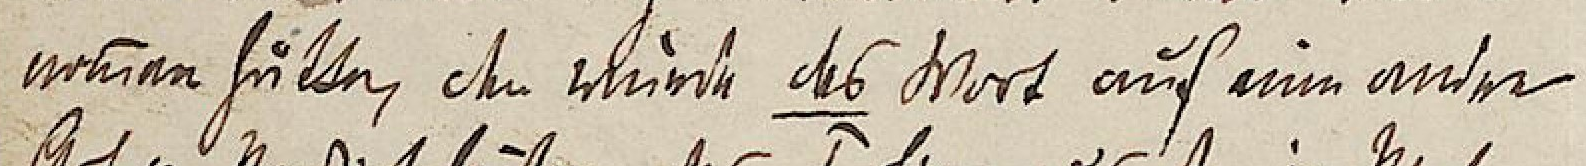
nomen hätte, den würde das Wort auf ein andre
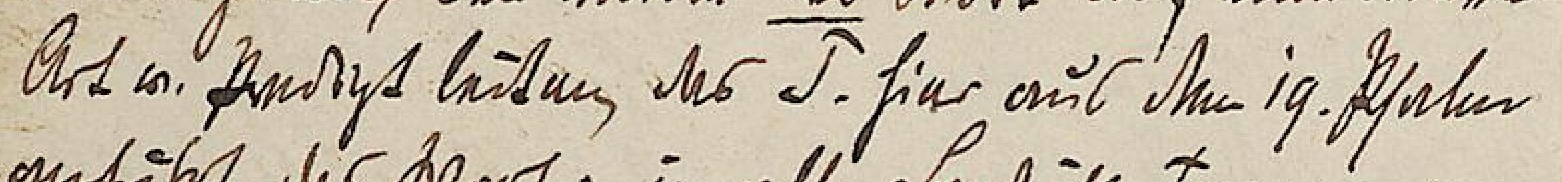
Art v. Predigt leiten, das P. hier aus dem 19. Psalm
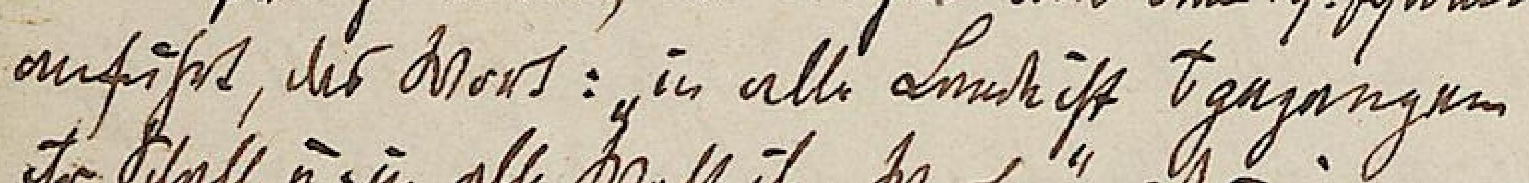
anfüht, das Wort: "in alle LAnde is sgegangen
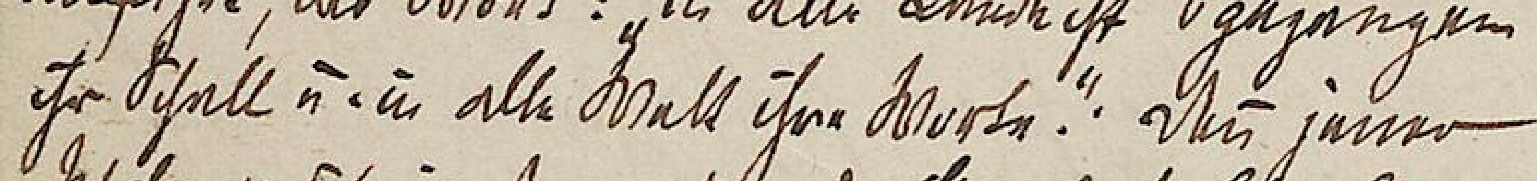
ihr Schall u. in alle Welt ihre Worte." Den jener
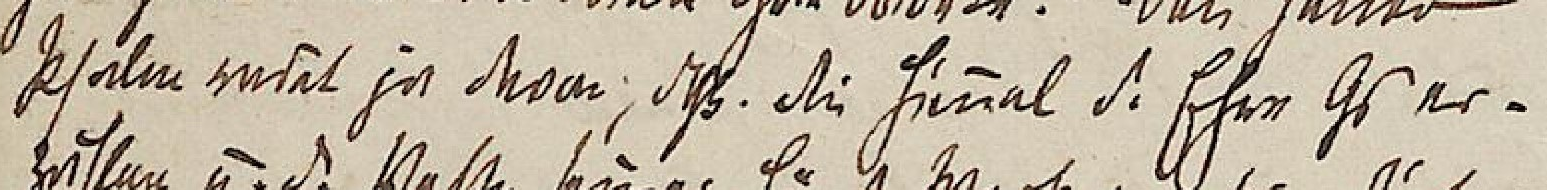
Psalm redet ja davon, daß die Himmel d. Ehre Gs er¬
